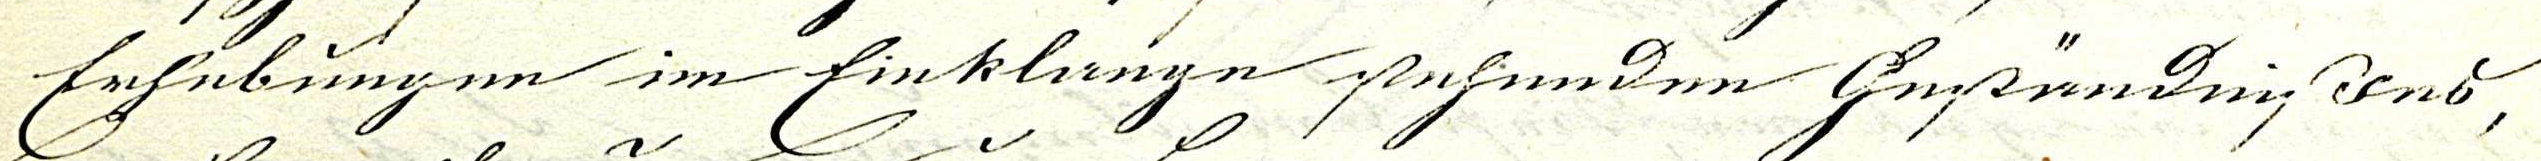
Erhebungen im Einklange stehenden Geständnißes,
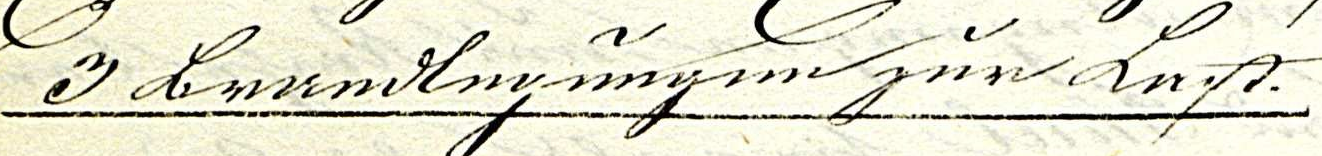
3 Brandlegungen zur Last.
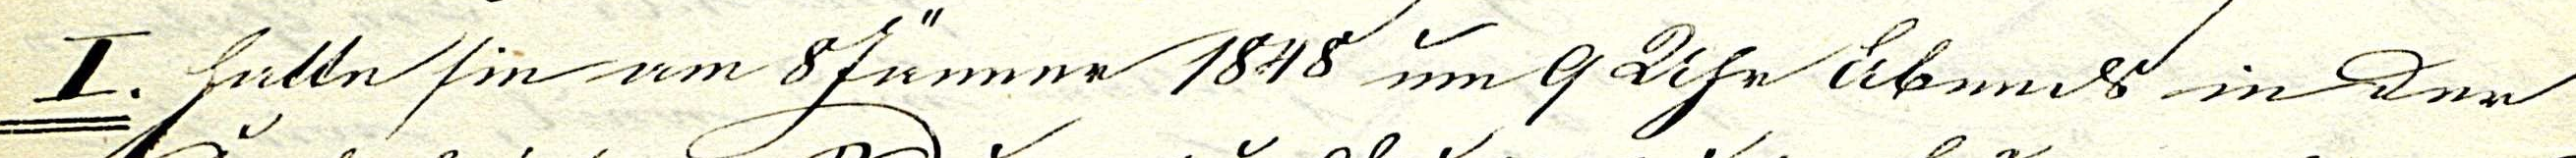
1. hatte sie am 8 Jänner 1848 um 9 Uhr Abends in der
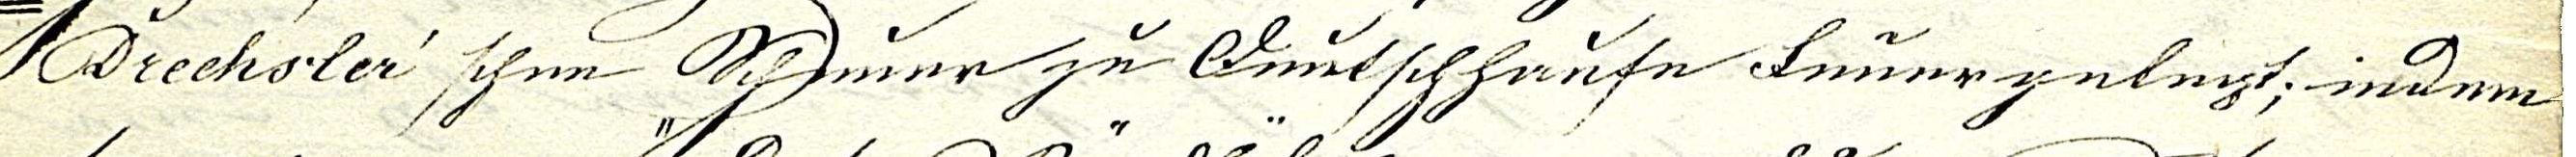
Drechsler’schen Scheuer zu Deutschhause Feuer gelegt; indem
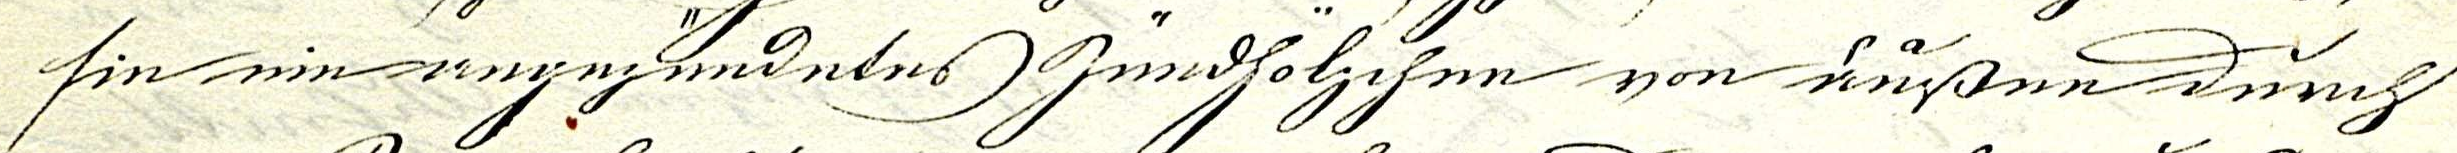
sie ein angezündetes Zündhölzchen von außen durch
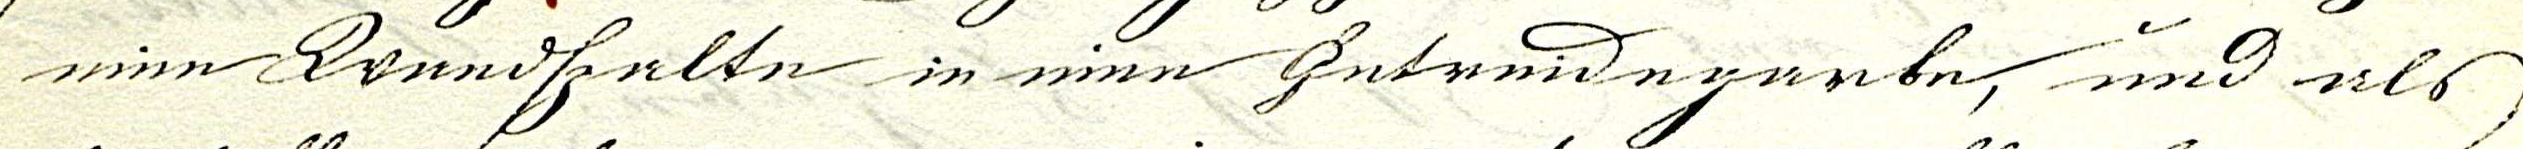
ein Wandspalte in eine Getreidegarbe, und als
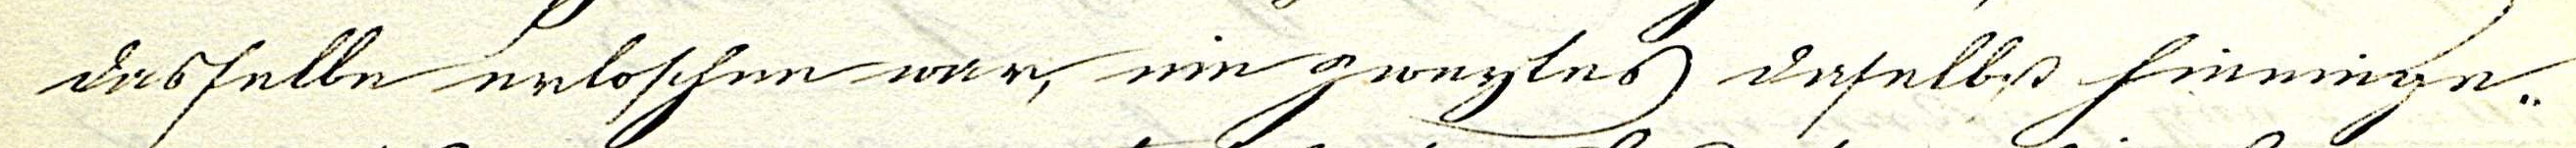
dasselbe erloschen war, ein zweytes daselbst hineinge¬
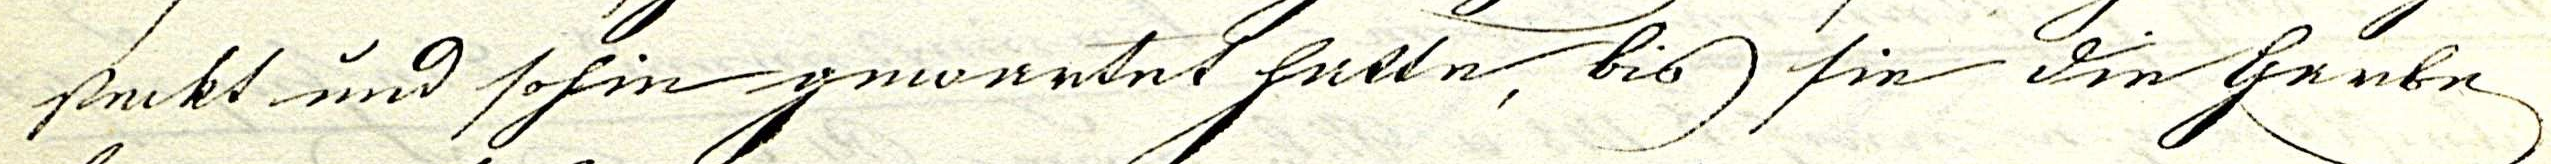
steckt und sohin gewartet hatte, bis sie die Garbe
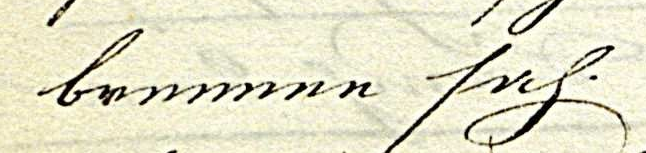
brennen sah.
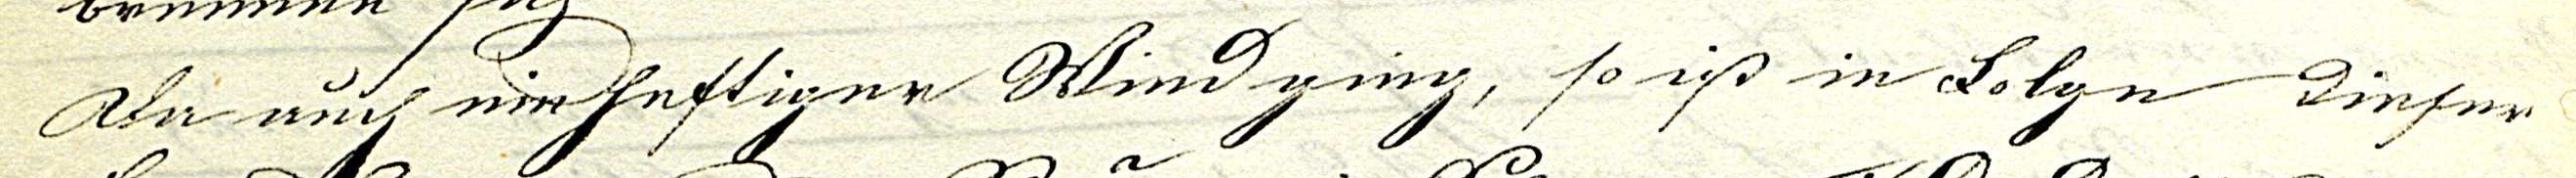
Da auch ein heftiger Wind ging, so ist in Folge dieser
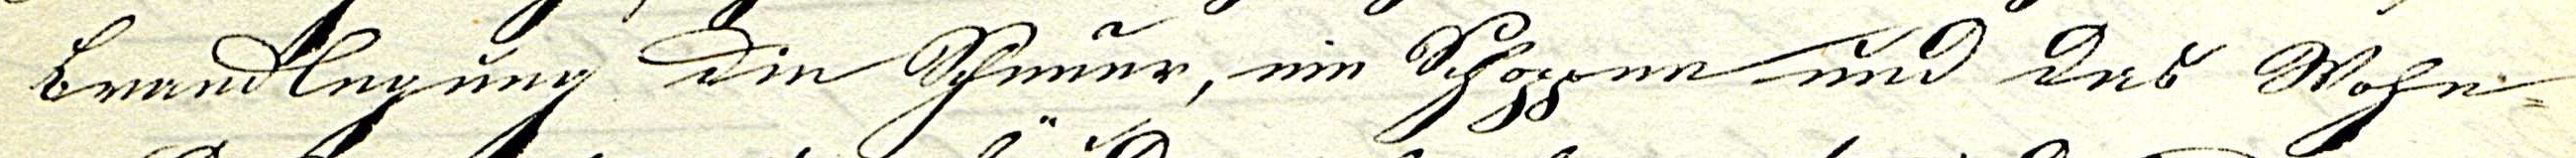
Brandlegung die Scheuer, ein Schoppen und das Wohn
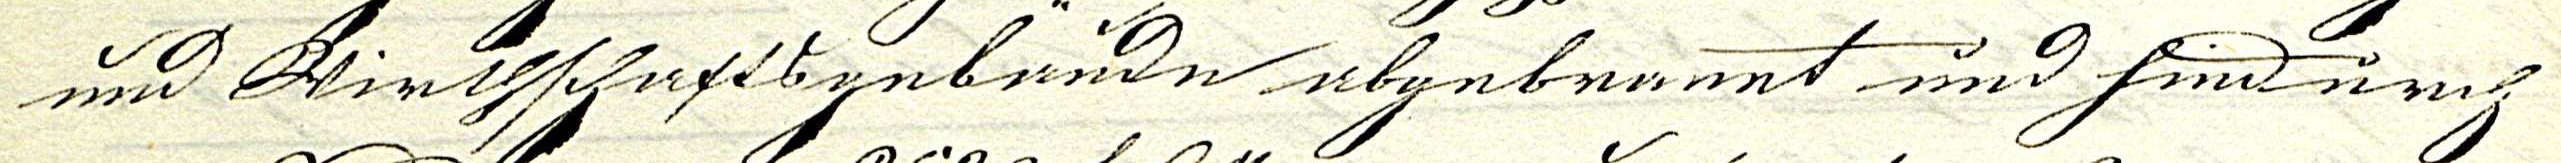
und Wirtschaftsgebäude abgebrannt und hindurch
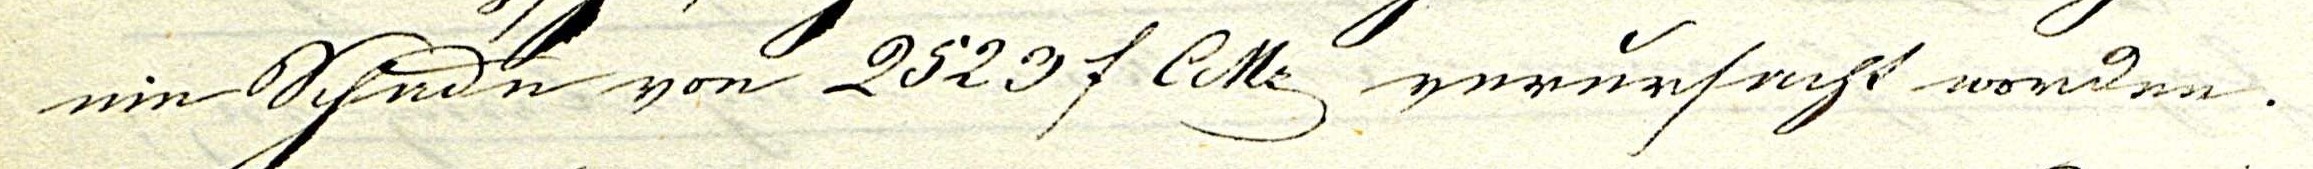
ein Schade von 2523f CM verursacht worden.
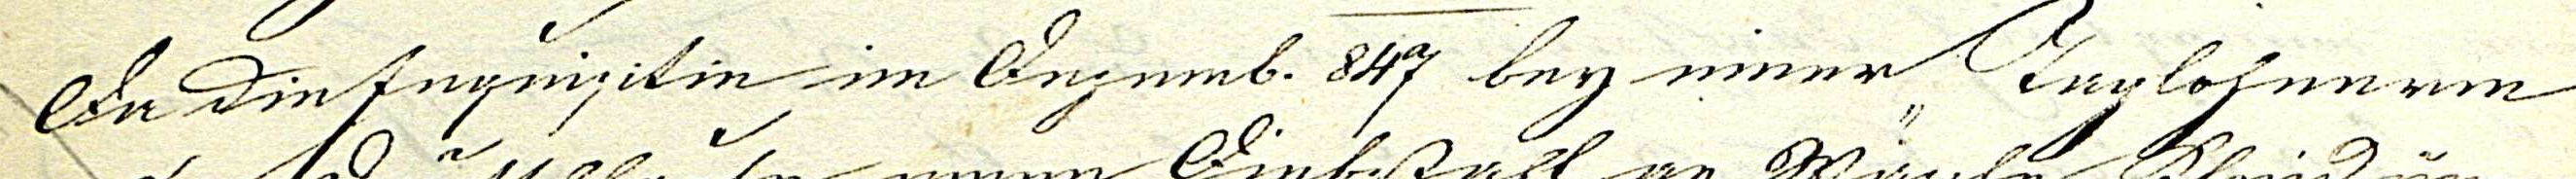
Da die Inquisiten im Dezemb. 847 bey einer Taglöhnerin
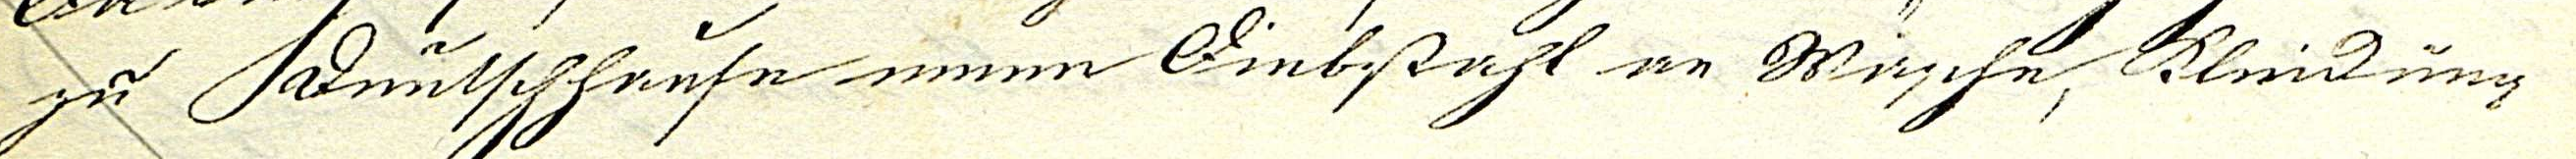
zu Deutschhause einen Diebstahl an Wäsche, Kleidung
